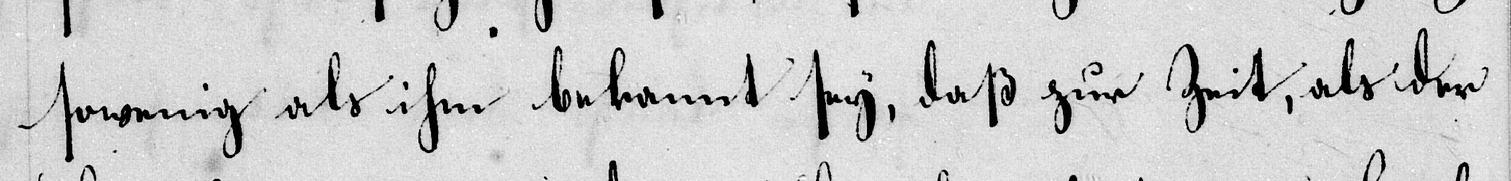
sowenig als ihm bekannt sey, daß zur Zeit, als der
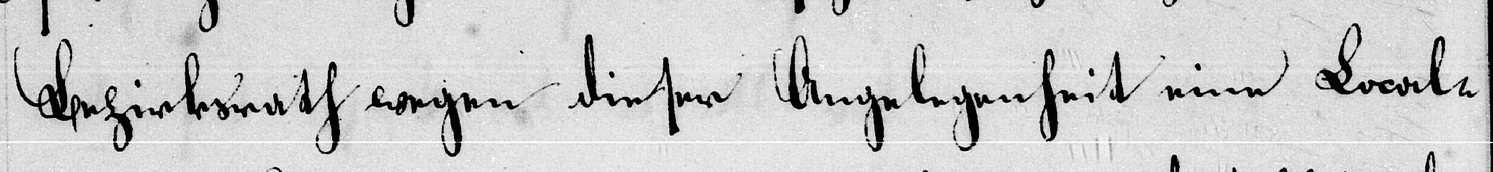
Bezirksrath wegen dieser Angelegenheit eine Local¬
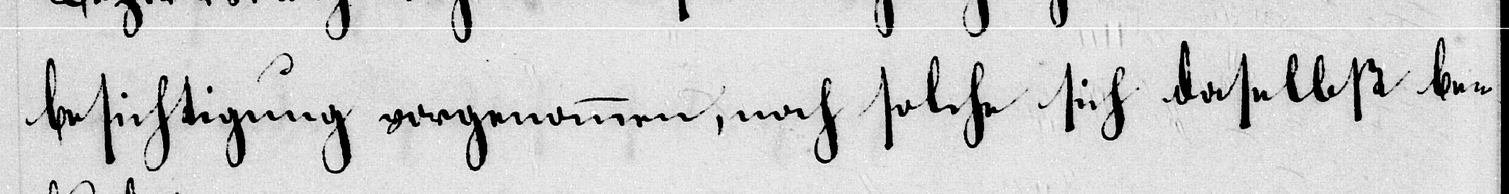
besichtigung vorgenommen, noch solche sich daselbst be¬
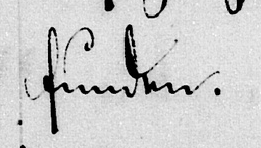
funden.
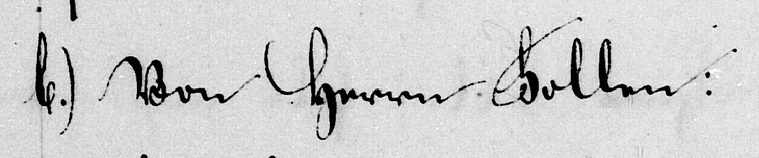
b.) Von Herrn Follen:
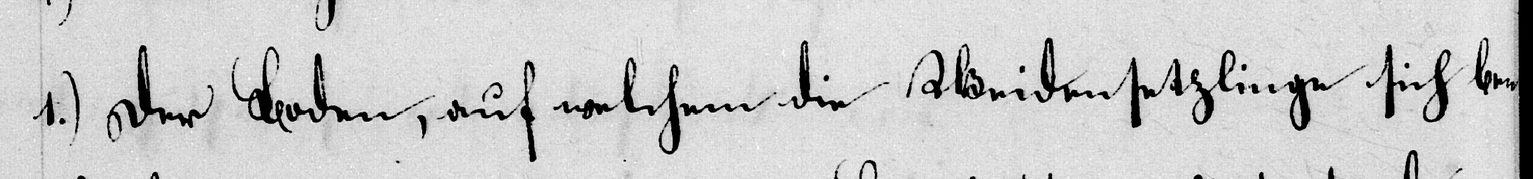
1.) Der Boden, auf welchem die Weidensetzlinge sich be¬
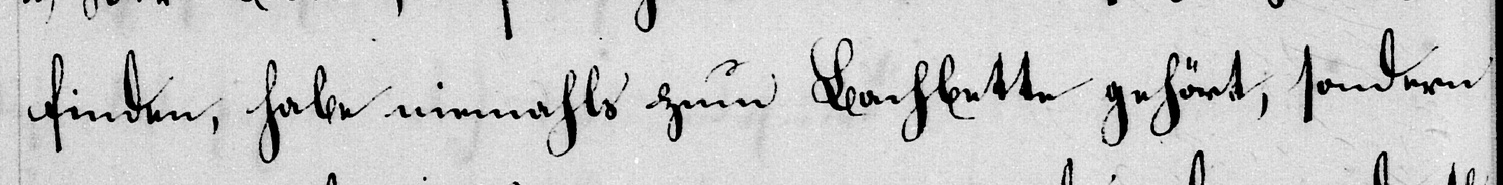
finden, habe niemahls zum Bachbette gehört, sondern
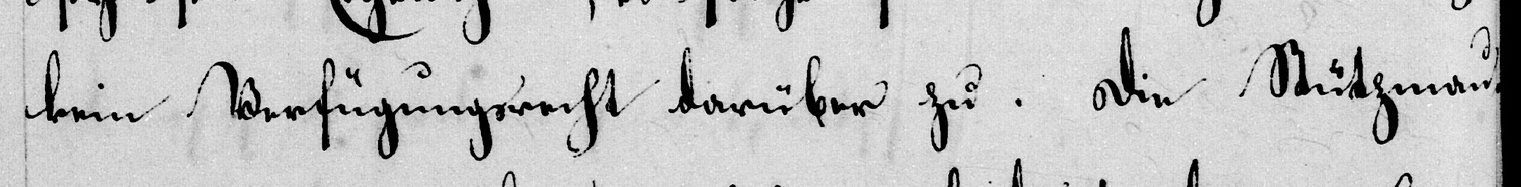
kein Verfügungsrecht darüber zu. Die Stützmau¬
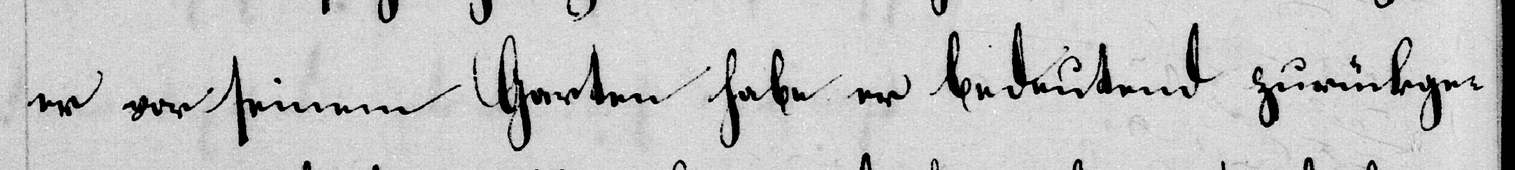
er vor seinem Garten habe er bedeutend zurückge¬
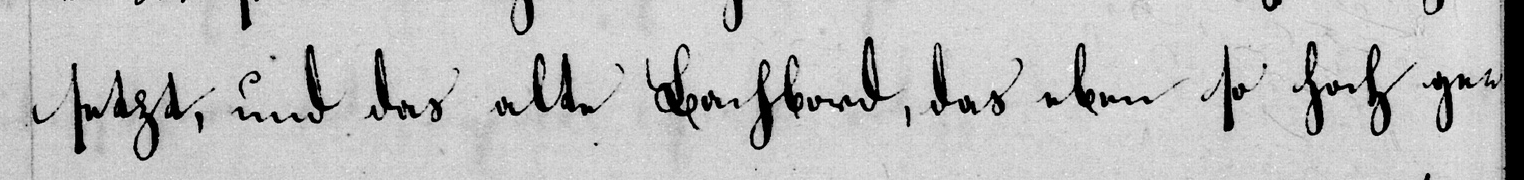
setzt, und das alte Bachbord, das eben so hoch ge-
